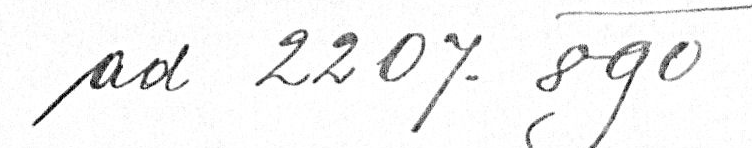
ad 2207. 890
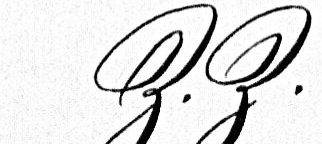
Z.Z.
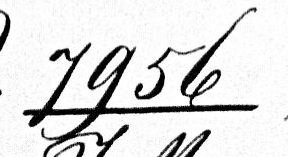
7956
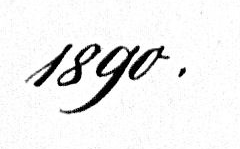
1890.
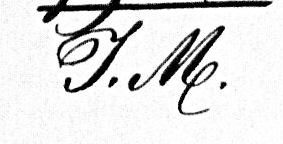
J. M.
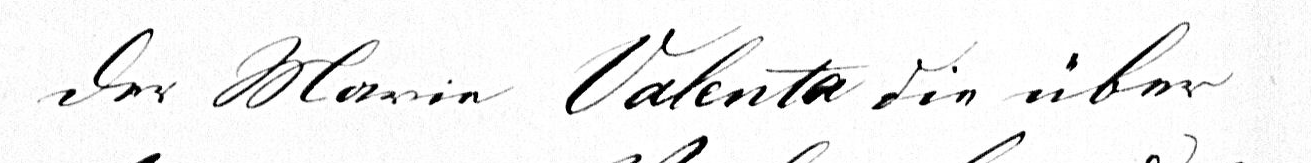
Der Marie Valenta die über
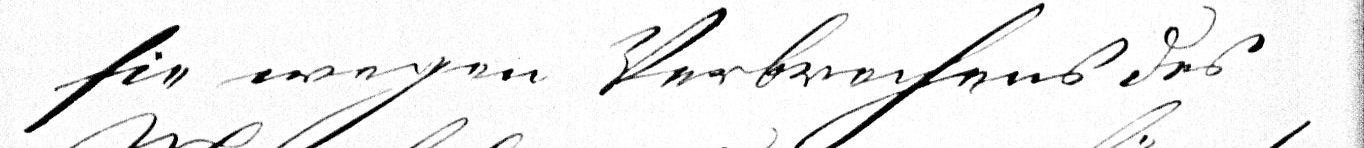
sie wegen Verbrochens des
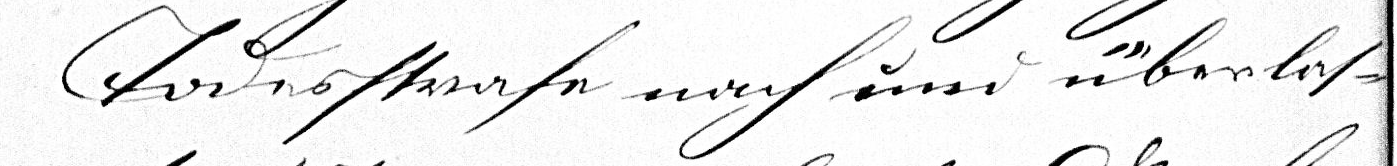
Todesstrafe nach und überlas¬
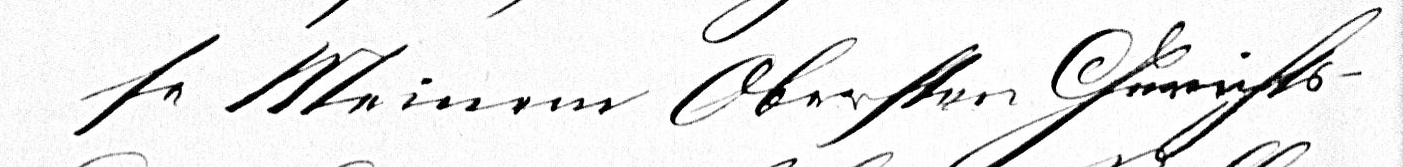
se Meinem Obersten Gerichts-
